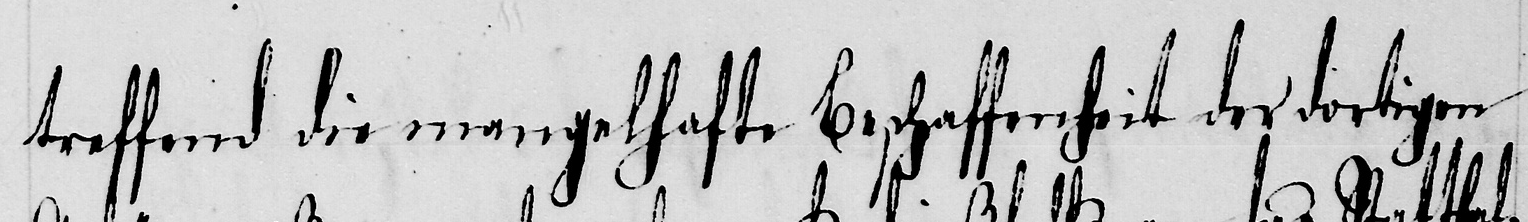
treffend die mangelhafte Beschaffenheit der dortigen
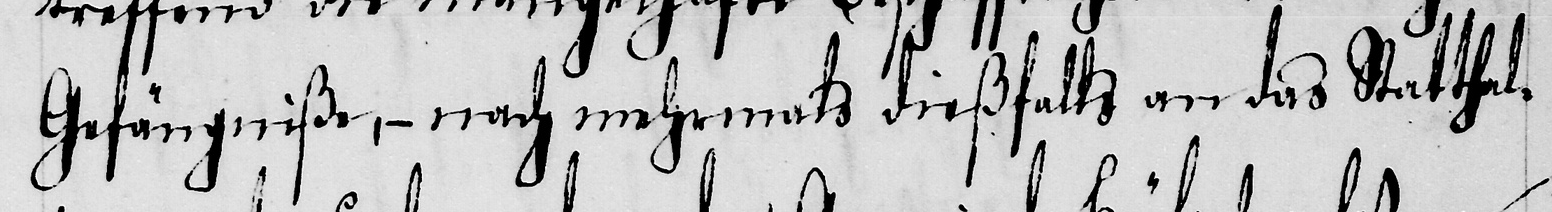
Gefängniße, – nach mehrmals dießfalls an das Statthal¬
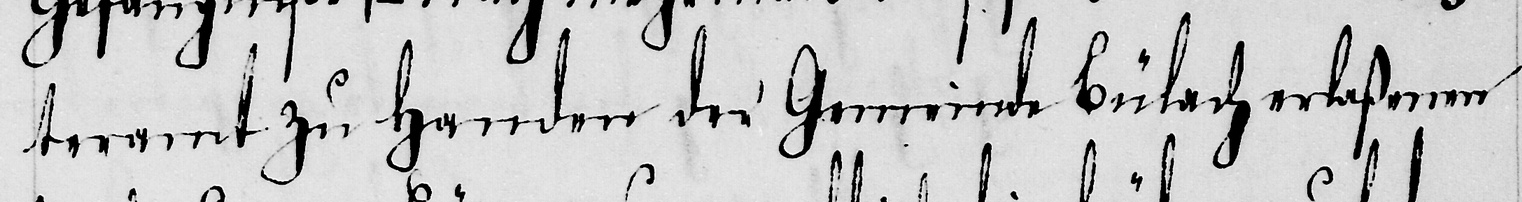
teramt zu Handen der Gemeinde Bülach erlaßenen
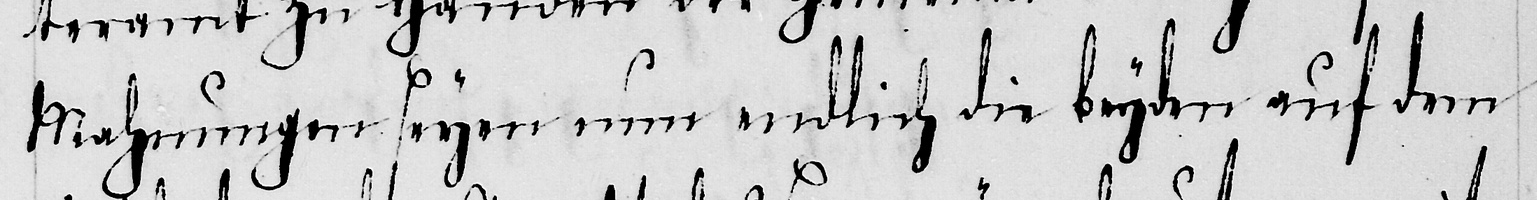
Mahnungen seyen nun endlich die beyden auf dem
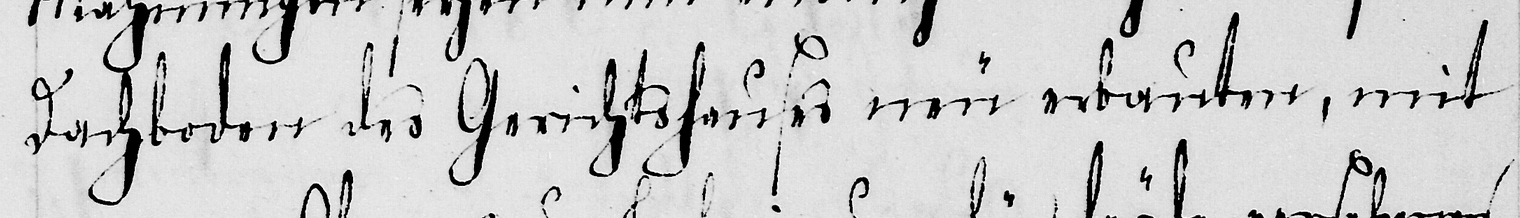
Dachboden des Gerichtshauses neu erbauten, mit
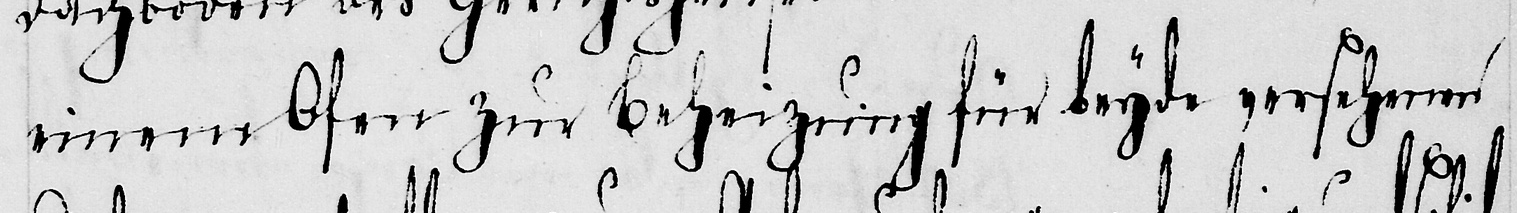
einem Ofen zur Beheizung für beyde versehenen
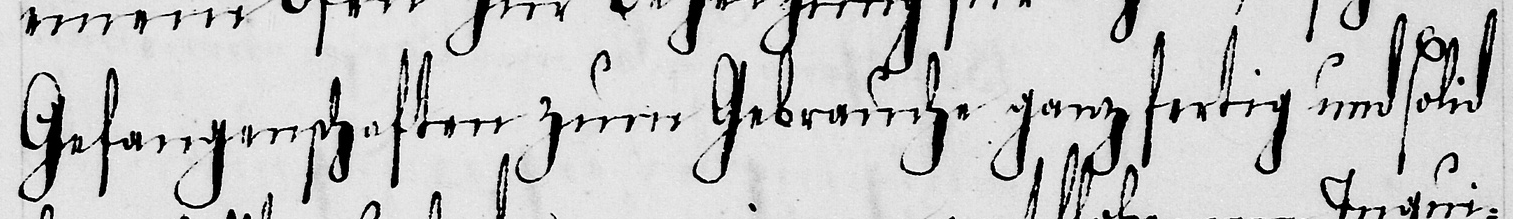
Gefangenschaften zum Gebrauche ganz fertig und solid
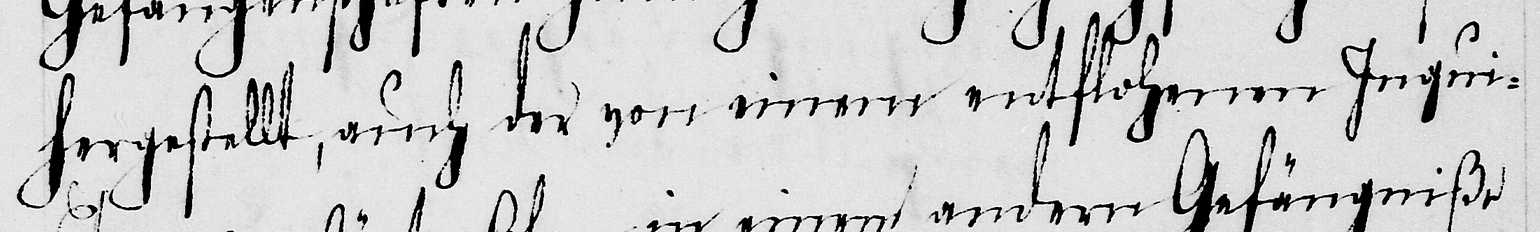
hergestellt, auch der von einem entflohenen Inqui¬
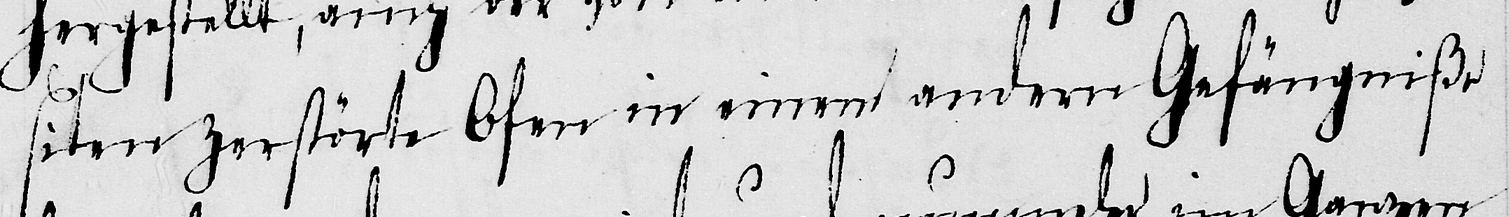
siten zerstörte Ofen in einem andern Gefängniße
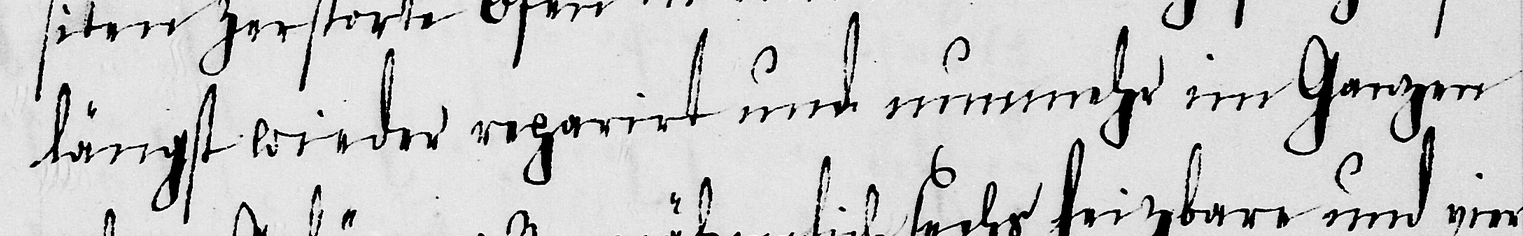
längst wieder reparirt und nunmehr im Ganzen
